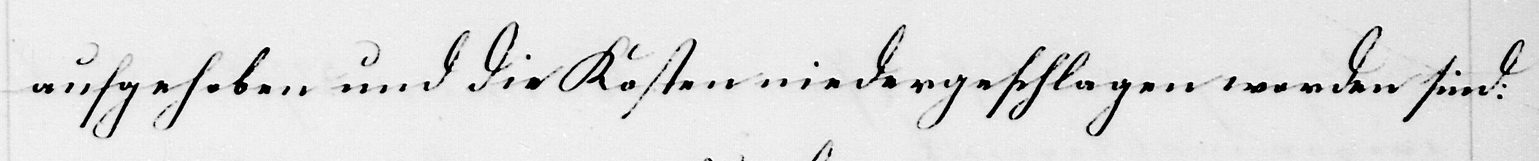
aufgehoben und die Kosten niedergeschlagen worden sind:
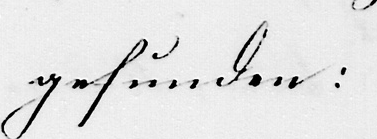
gefunden:
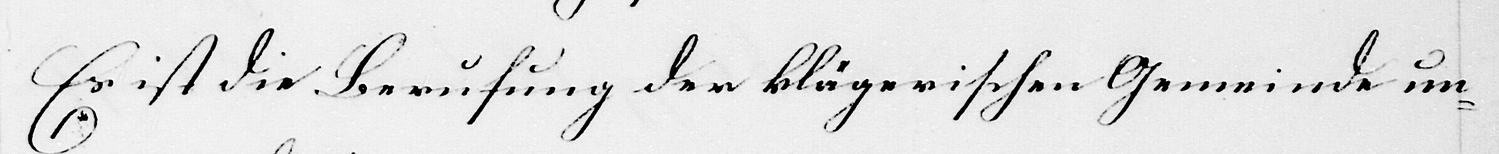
Es ist die Berufung der klägerischen Gemeinde un¬
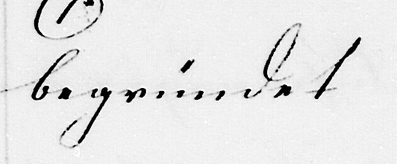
begründet
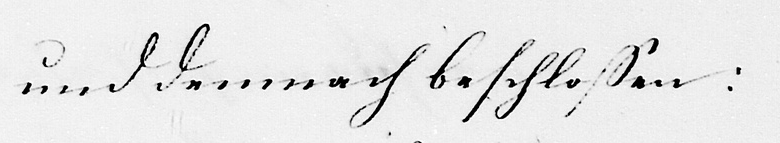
und demnach beschloßen:
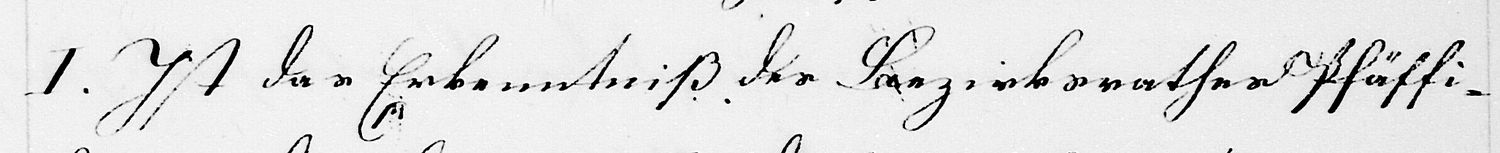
I. Ist das Erkenntniß des Bezirksrathes Pfäffi¬
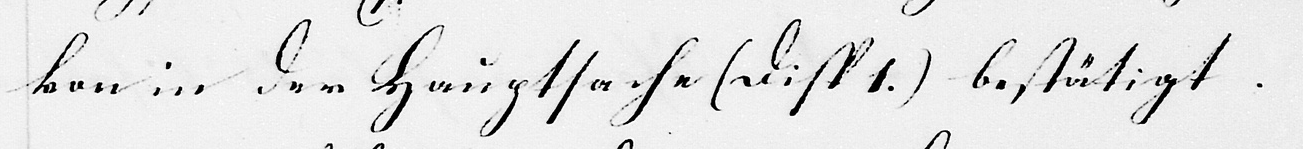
kon in der Hauptsache (Disp 1.) bestätigt.
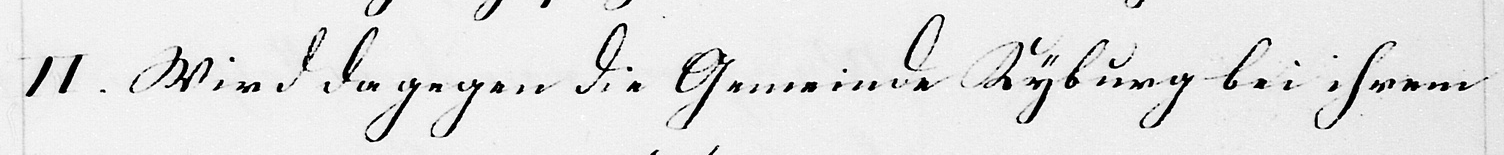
II. Wird dagegen die Gemeinde Kyburg bei ihrem
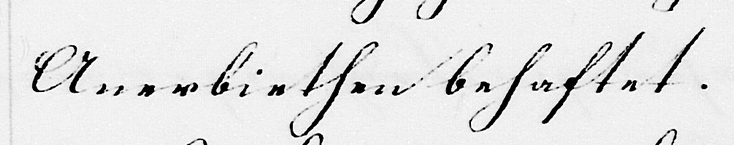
Anerbiethen behaftet.
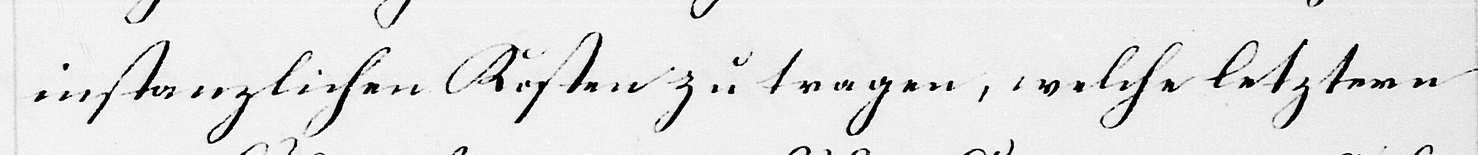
instanzlichen Kosten zu tragen, welche letztern
